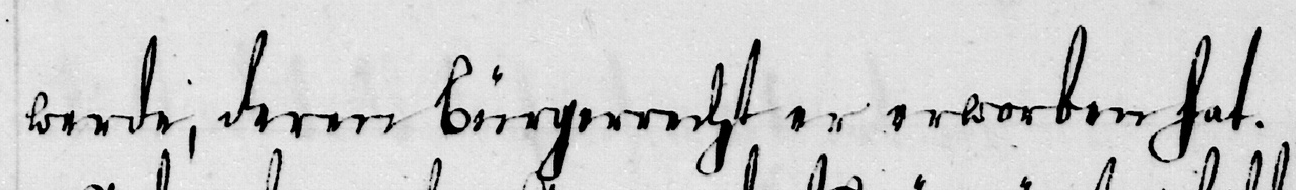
werde, deren Bürgerrecht er erworben hat.
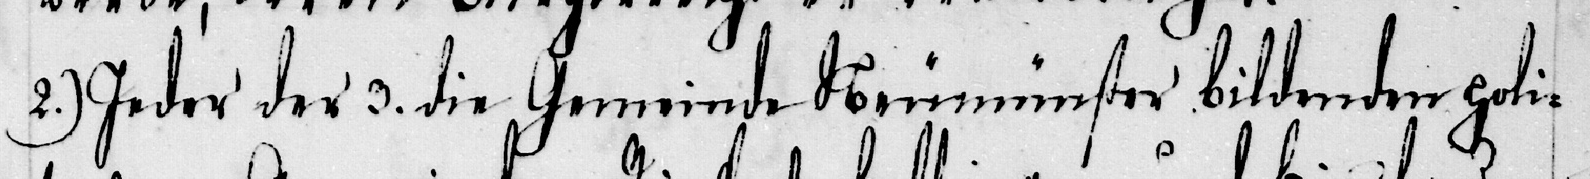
2.) Jeder der 3. die Gemeinde Neumünster bildenden poli¬
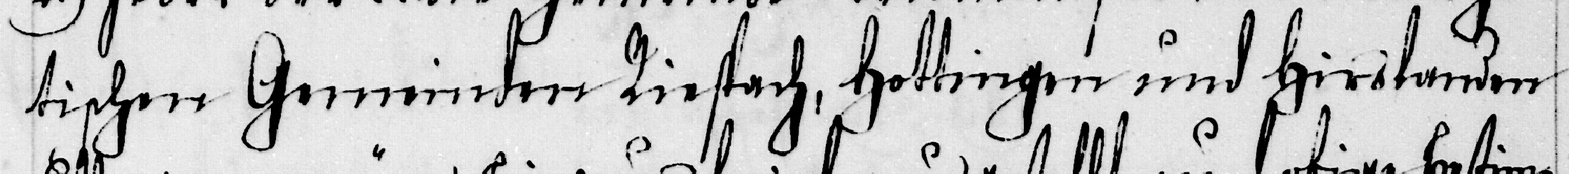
tischen Gemeinden Riespach, Hottingen und Hirslanden
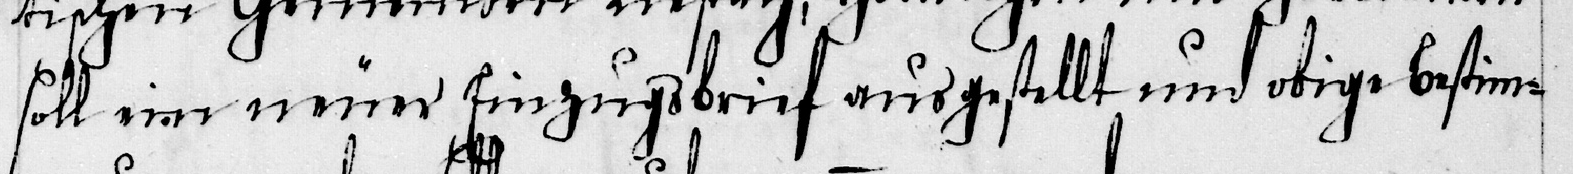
soll ein neuer Einzugsbrief ausgestellt und obige Bestim¬
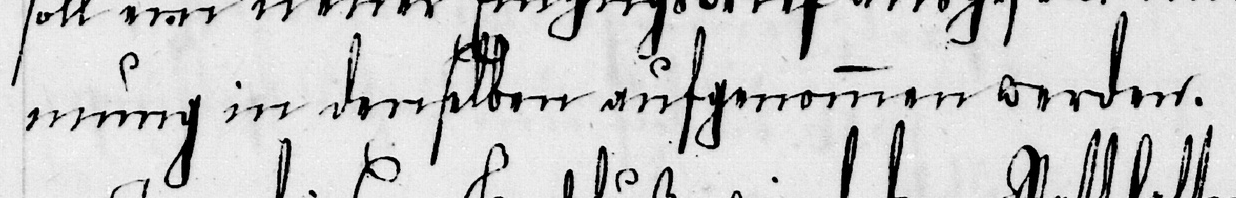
mung in denselben aufgenommen werden.
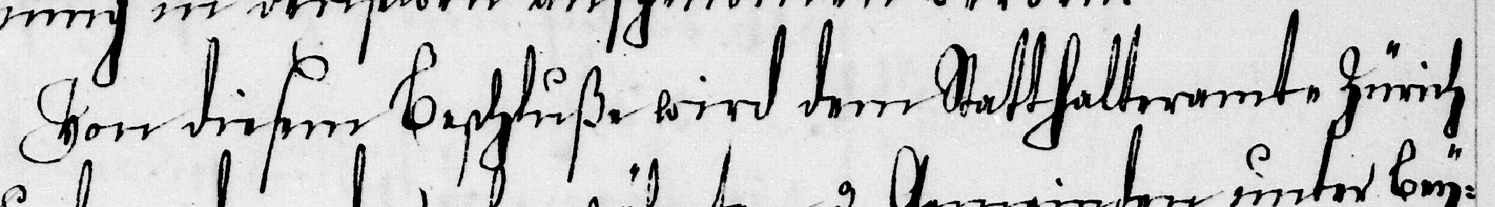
Von diesem Beschluß wird dem Statthalteramte Zürich
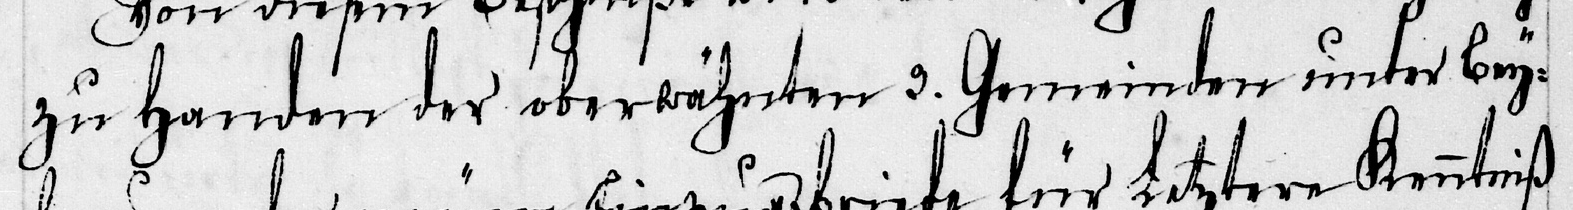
zu Handen der oberwähnten 3. Gemeinden unter Bey¬
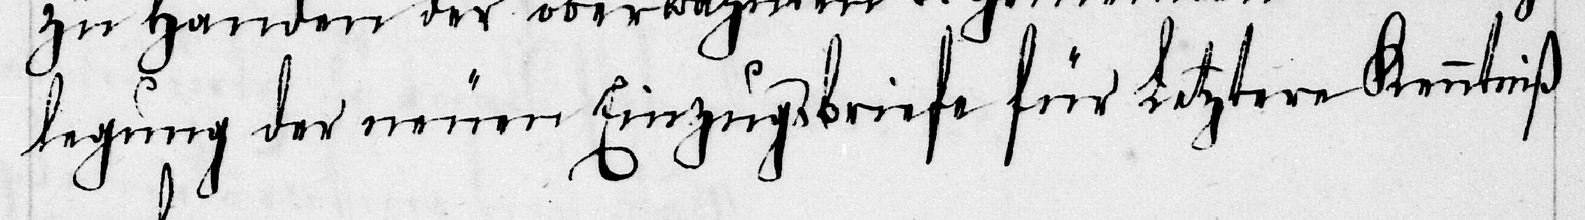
legung der neuen Einzugsbriefe für Letztere Kenntniß
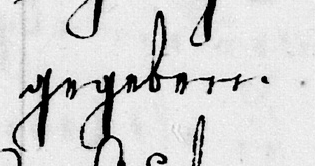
gegeben.
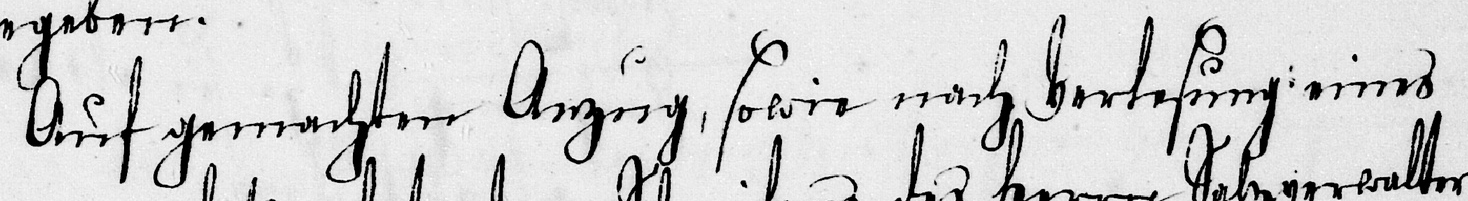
Auf gemachten Anzug, sowie nach Verlesung eines
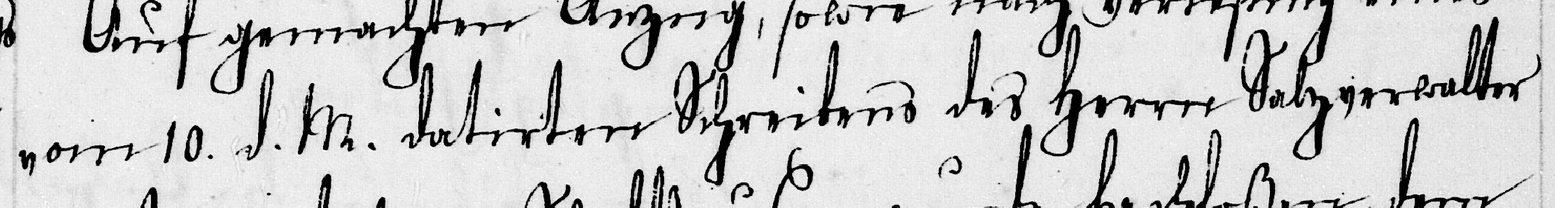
vom 10. d. M. datirten Schreibens des Herrn Salzverwalter
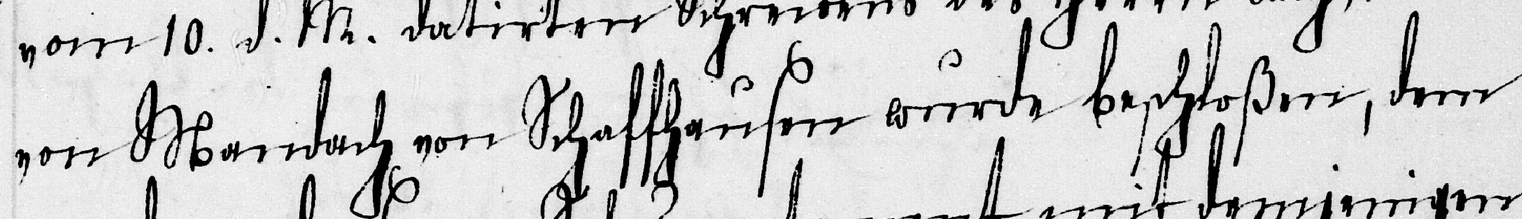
von Mandach von Schaffhausen wurde beschloßen, dem
